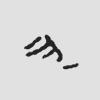勿
